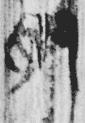肥
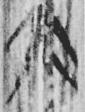大
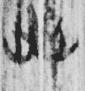卉（草）
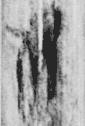木
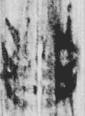晉
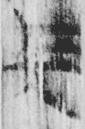長
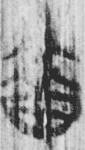昔
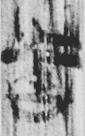者
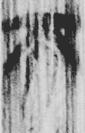天
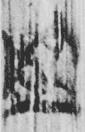○（地）
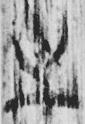之
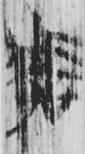差（佐）
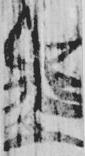○（舜）
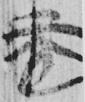而
